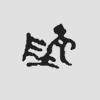地
